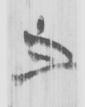之
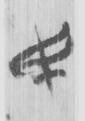民
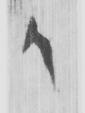人
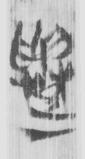{與口止}
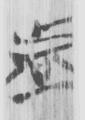者
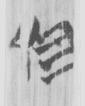於
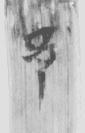邑
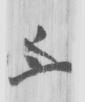之
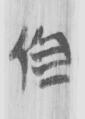於
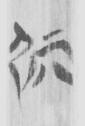凥
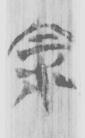余
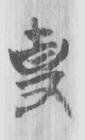吏
